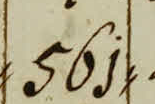561
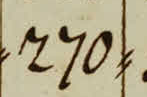270
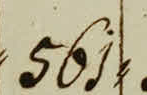561
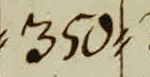350
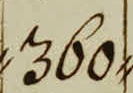360
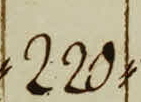220
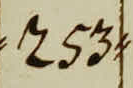253
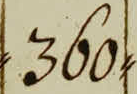360
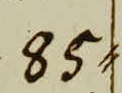85
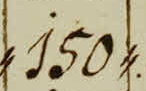150
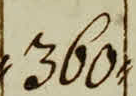360
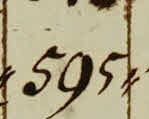595
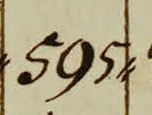595
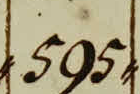595
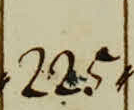225
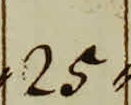25
